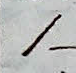1
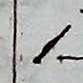1
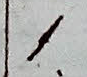1
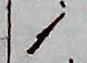1
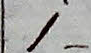1
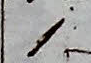1
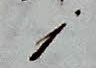1
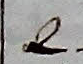2
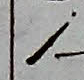1
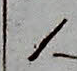1
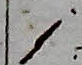1
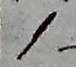1
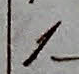1
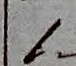1
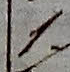1
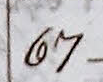67
